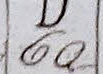60
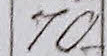70
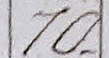70
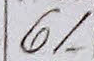61
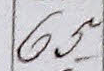65
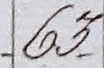63
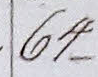64
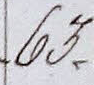63
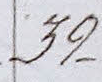39
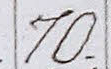70
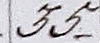35
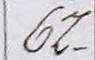62
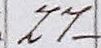27
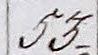53
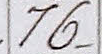76
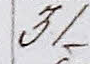31
